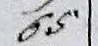65
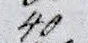40
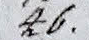46
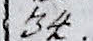34
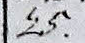25
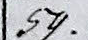59
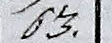63.
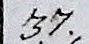37
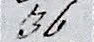36
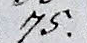75
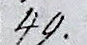49
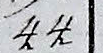44
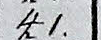41.
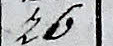26
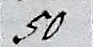50
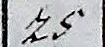25
